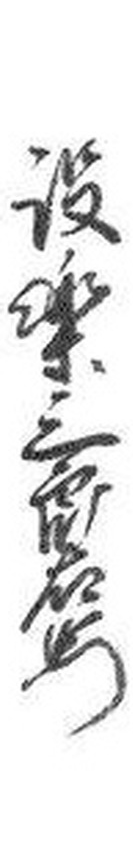設楽三郎右衛門
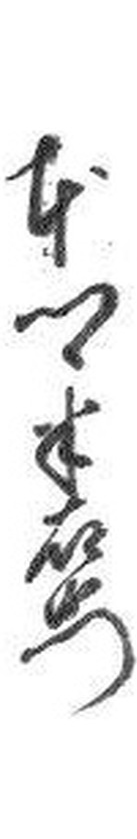本郷半右衛門
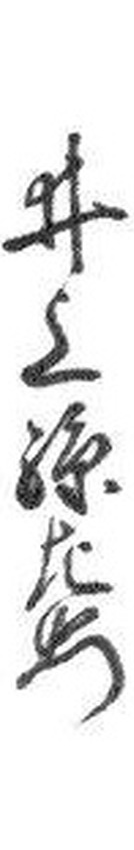井上孫左衛門
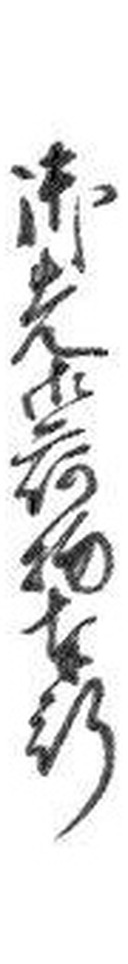御先御荷物奉行
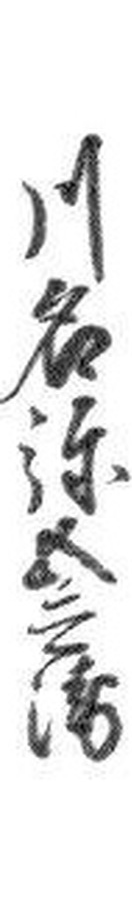川名弥五兵衛
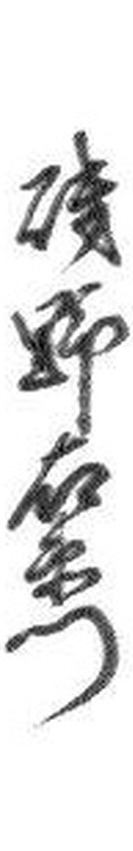磯野右衛門
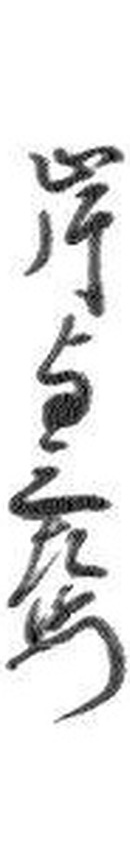岸与三左衛門
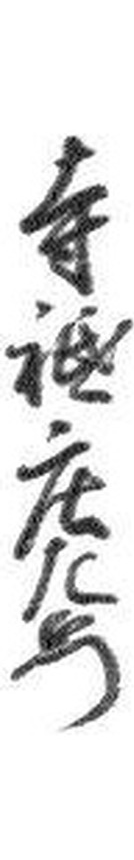寺祇庄左衛門
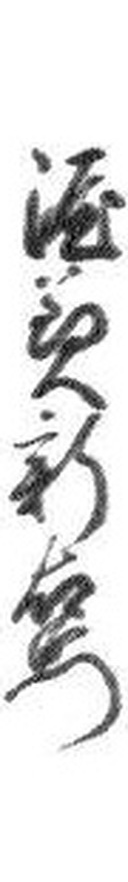渥美新右衛門
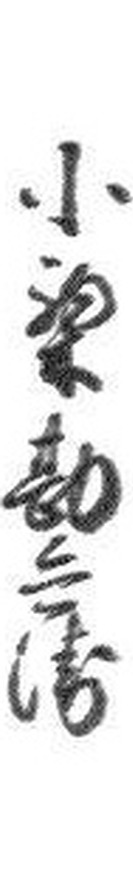小栗勘兵衛
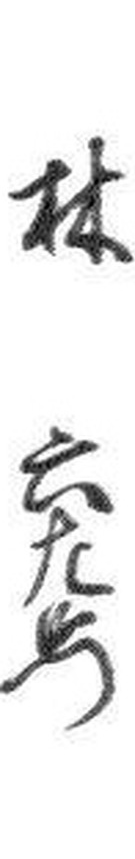林六左衛門
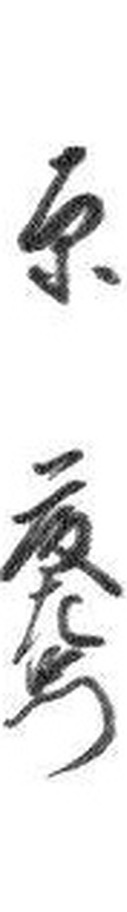原藤左衛門
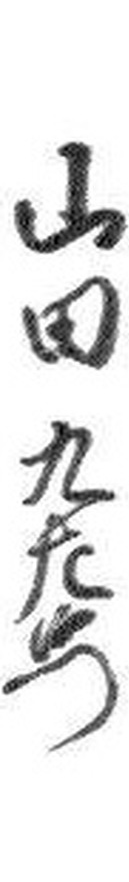山田九左衛門
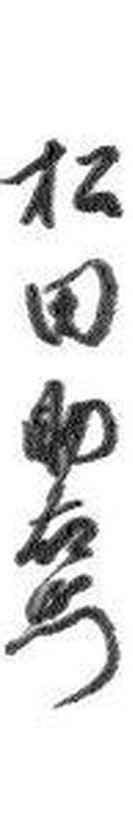松田助右衛門

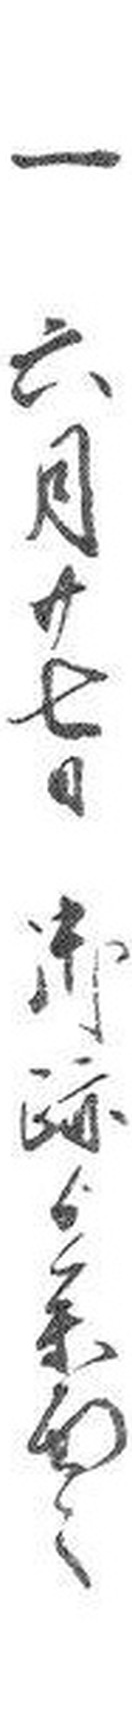一六月廿七日御跡ゟ参面々
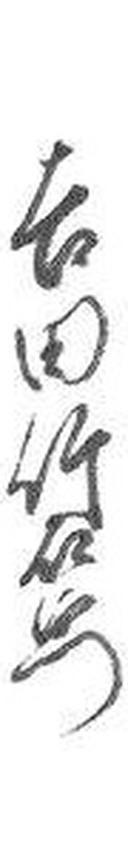吉田竹右衛門
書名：家譜 四 忠昌公 従寛永七年到正保四年
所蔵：福井県文書館 Fukui Prefectural Archives
